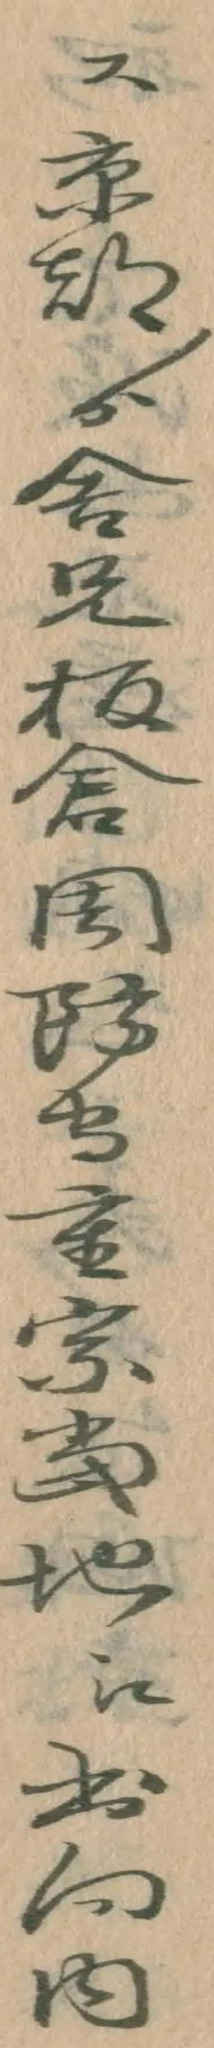ス京都ゟ舎兄板倉周防守重宗当地江出向内
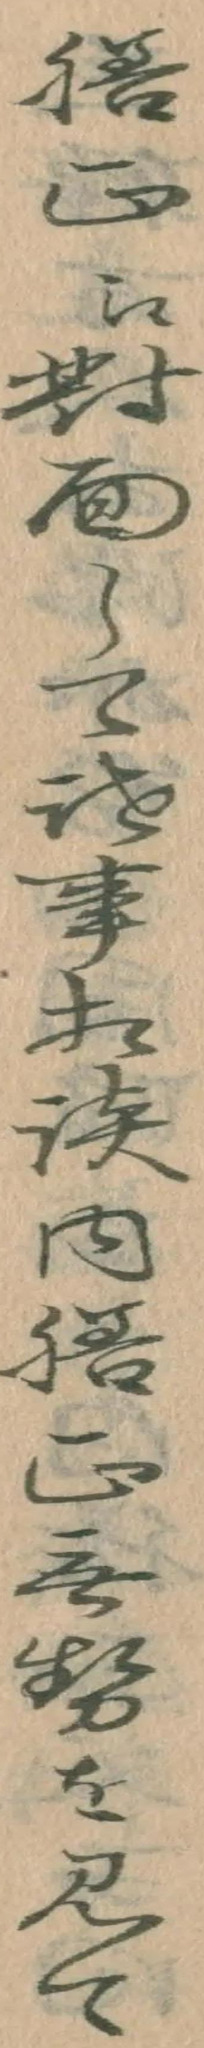膳正江対面して諸事相談内膳正無勢を見て
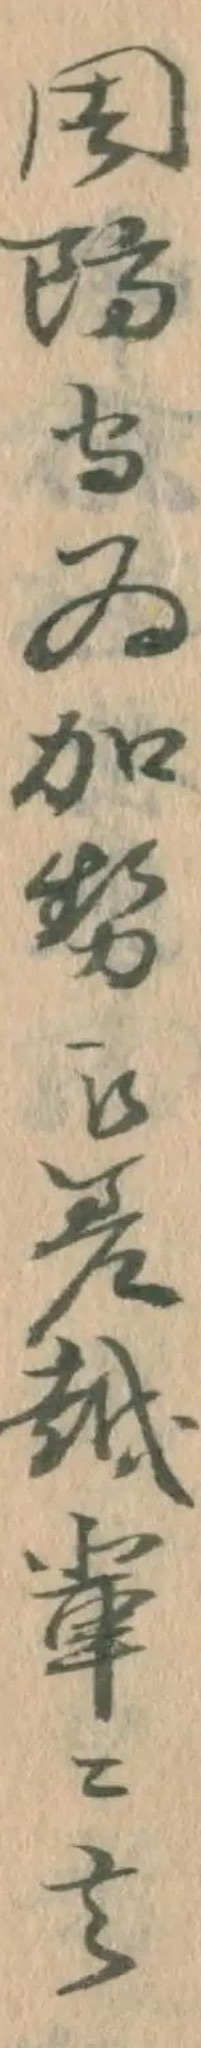周防守為加勢被差越輩には
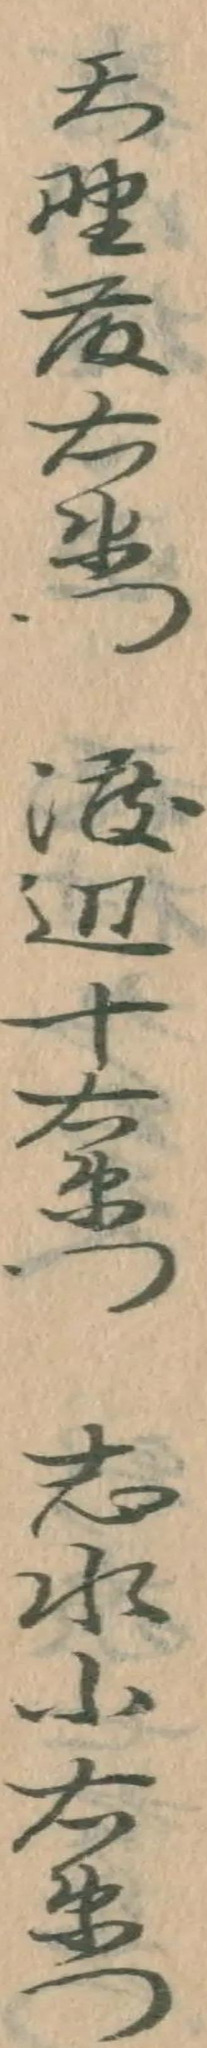天野藤右衛門渡辺十右衛門志水小右衛門
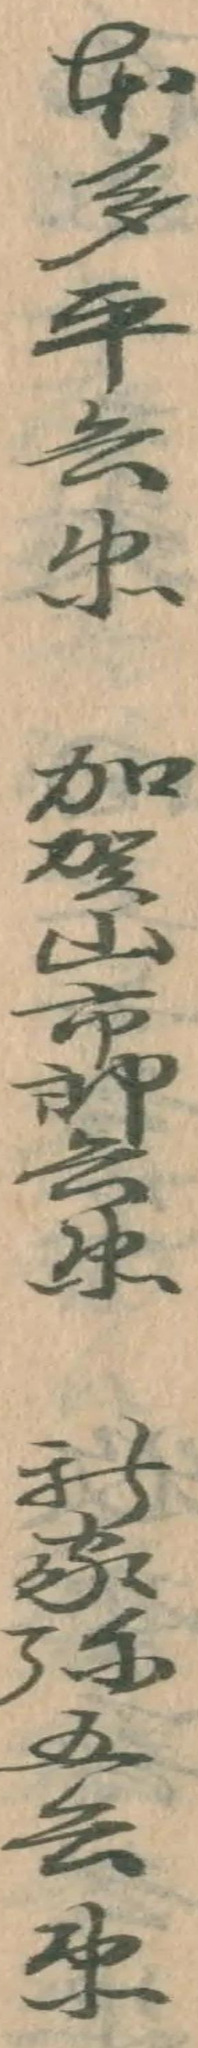本多平兵衛加賀山市郎兵衛新家弥五兵衛

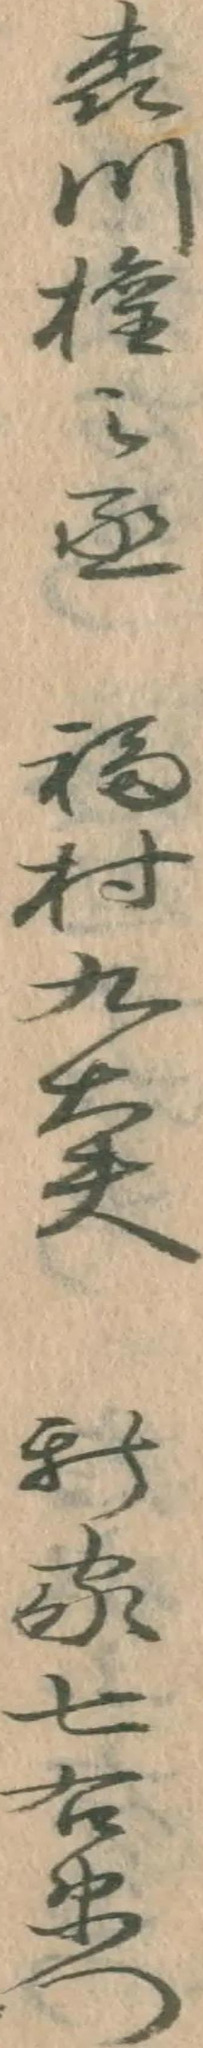森川権之丞福村九大夫新家七右衛門
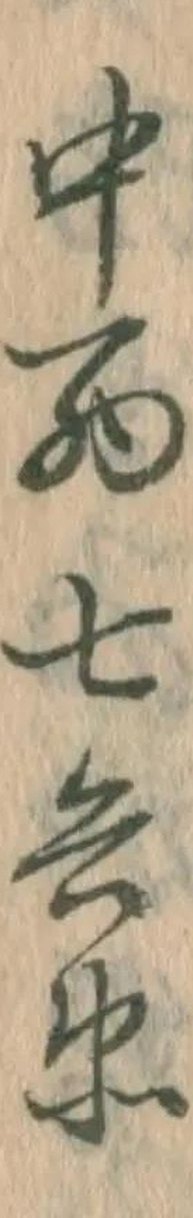中西七兵衛
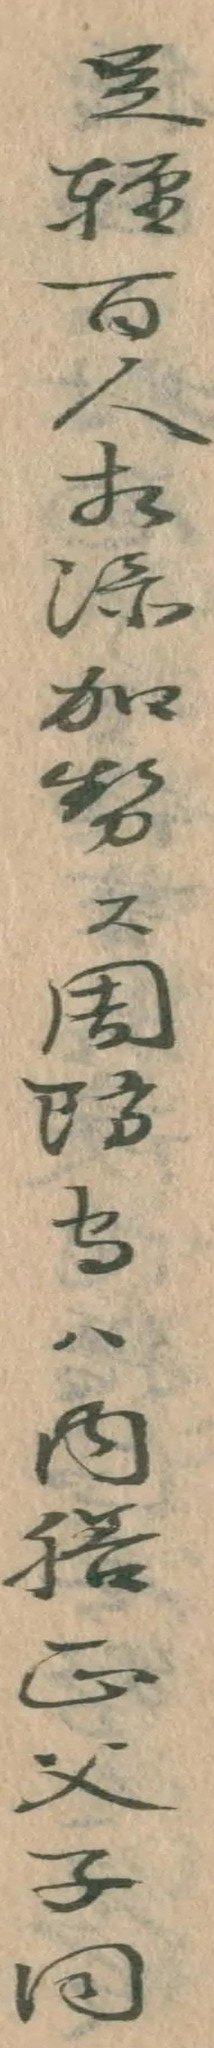足軽百人相添加勢ス周防守は内膳正父子同
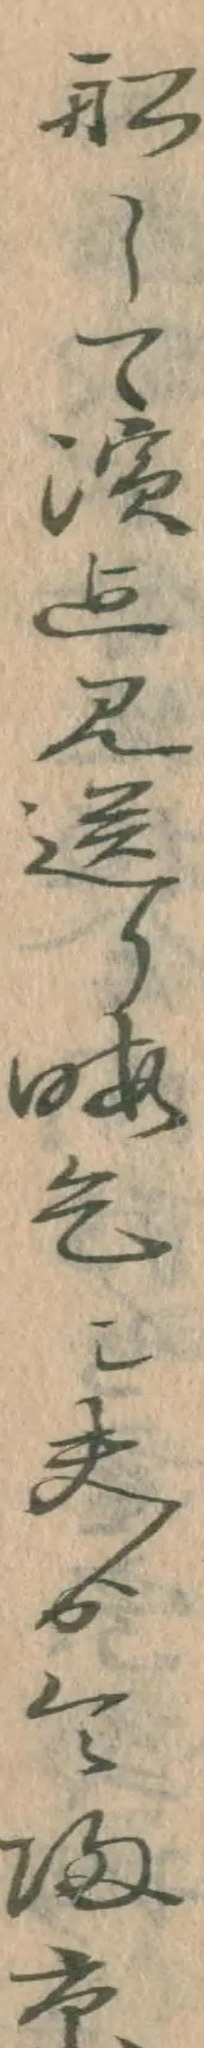船して浜迄見送り暇乞シ夫ゟ令帰京
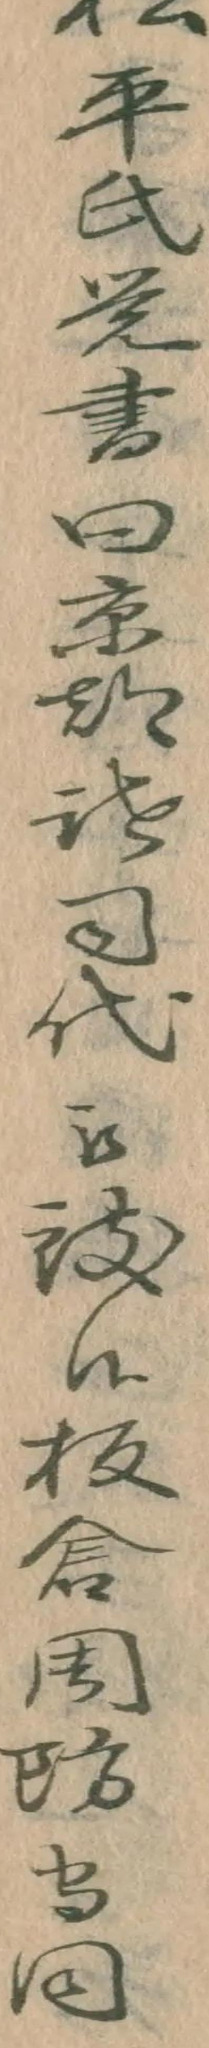松平氏覚書曰京都諸司代被致候板倉周防守同
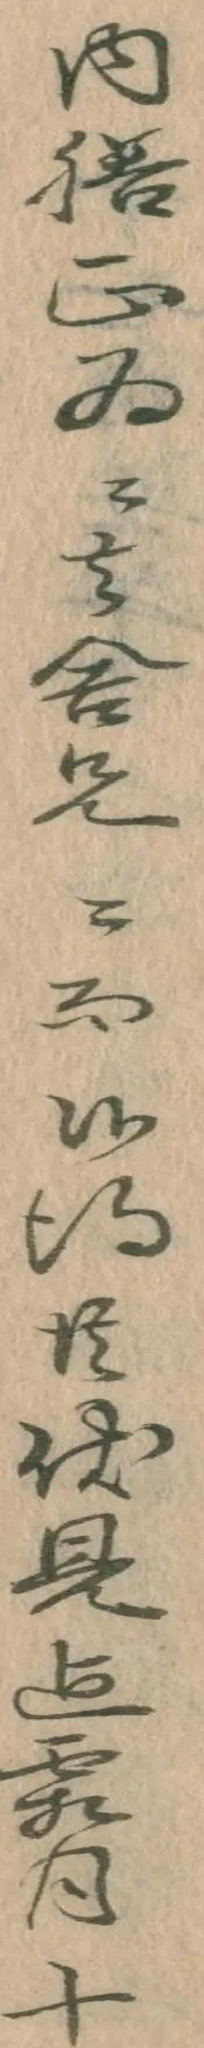内膳正為には舎兄に而候得共伏見迄霜月十
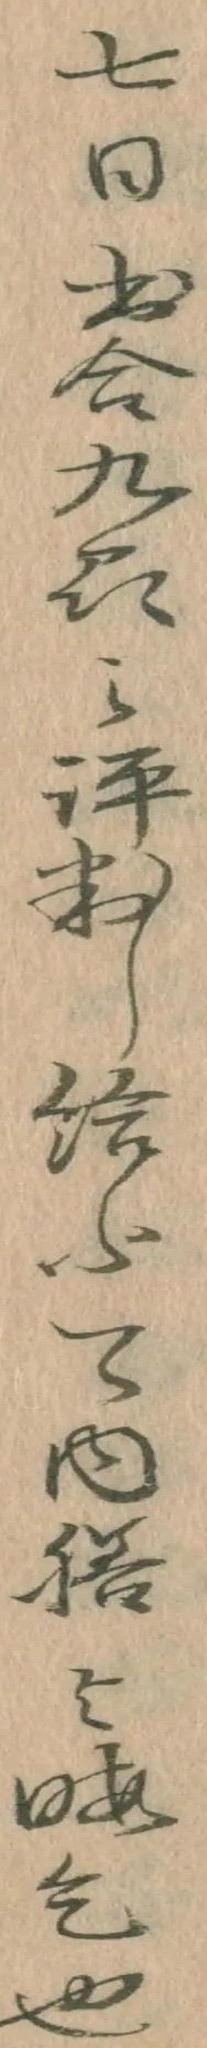七日出合九州之評判し給ふて内膳と暇乞也
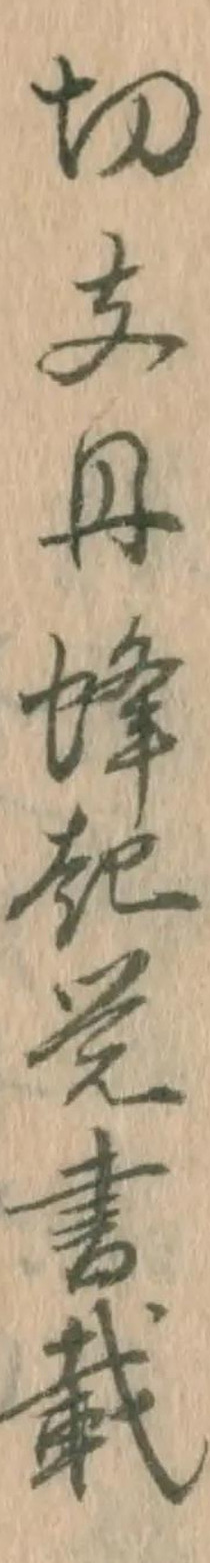切支丹蜂起覚書載
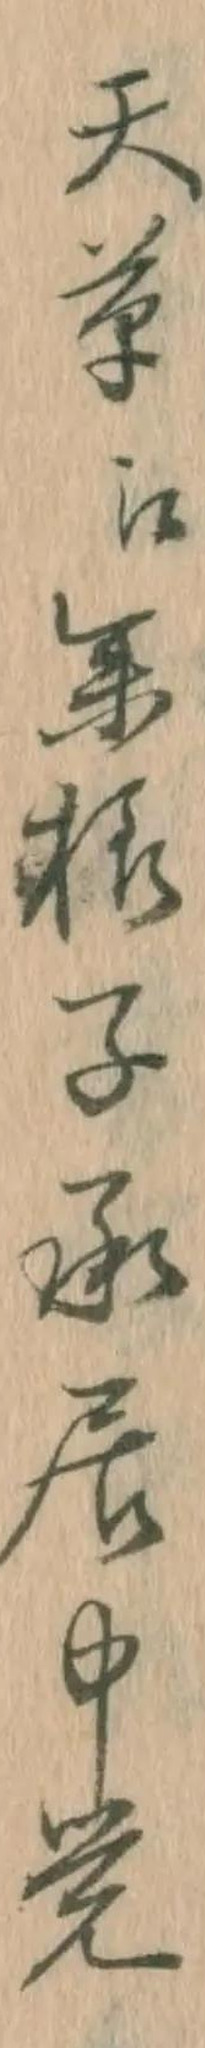天草江参様子承居申覚
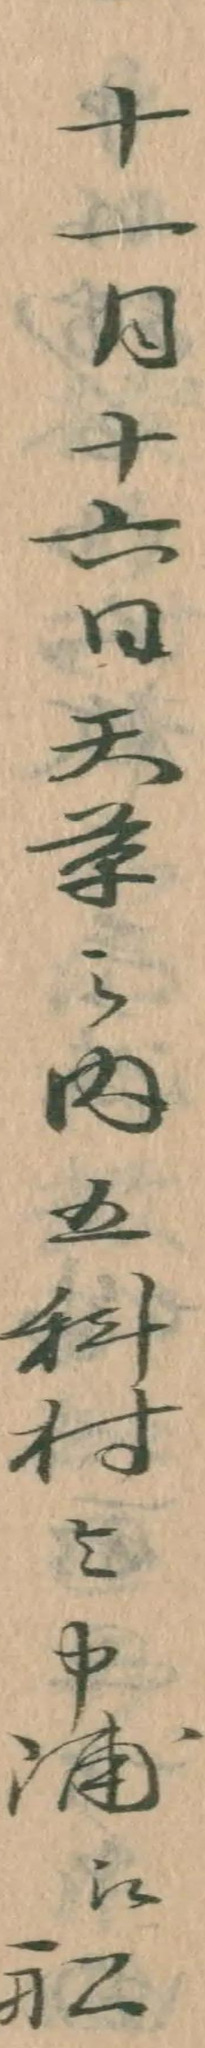一十一月十六日天草之内五科村と申浦江船
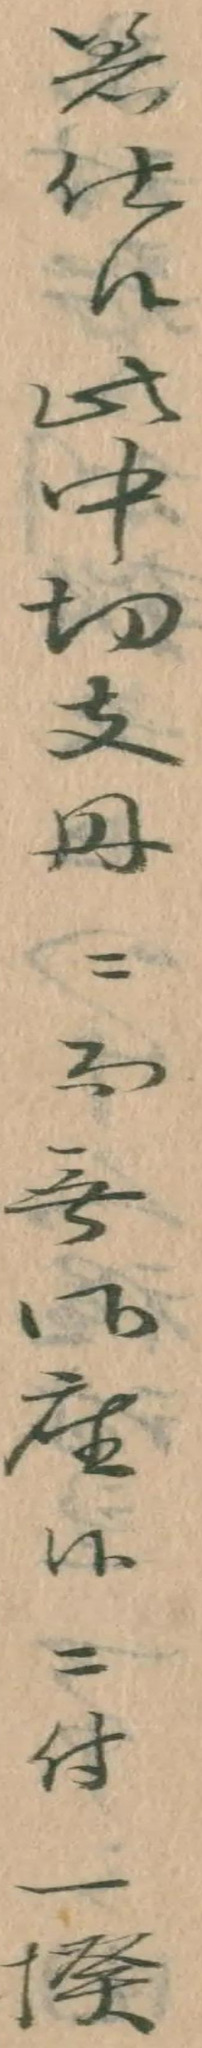着仕候此中切支丹に而無御座候に付一揆
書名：切支丹御退治記 49巻. [3]
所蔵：国立国会図書館 National Diet Library, JAPAN
